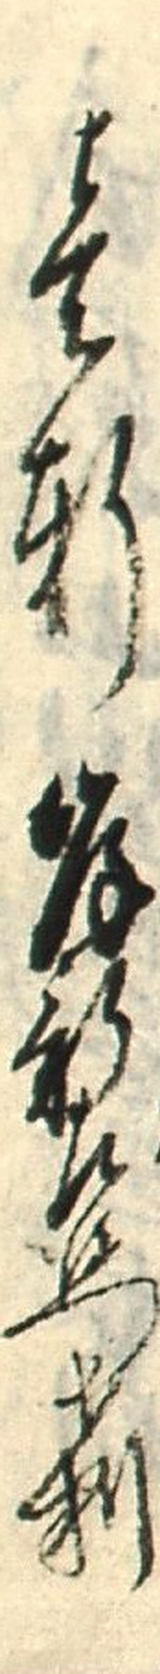壱軒岸新左衛門才判
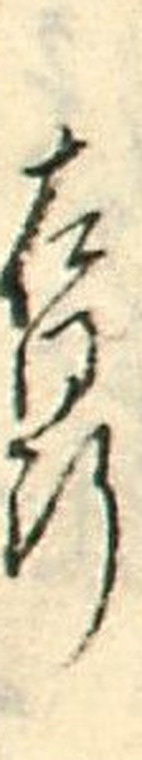右同断
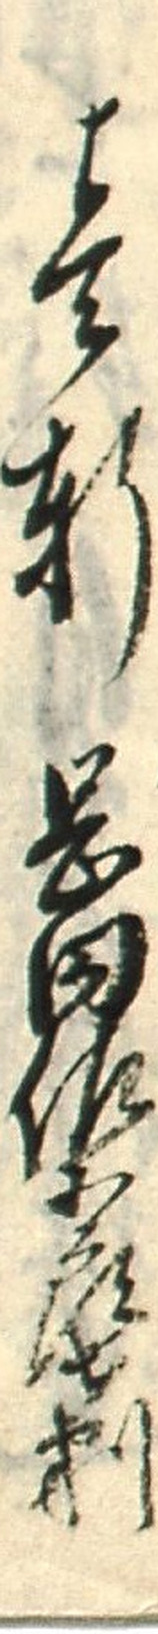壱軒岡田佐五郎才判
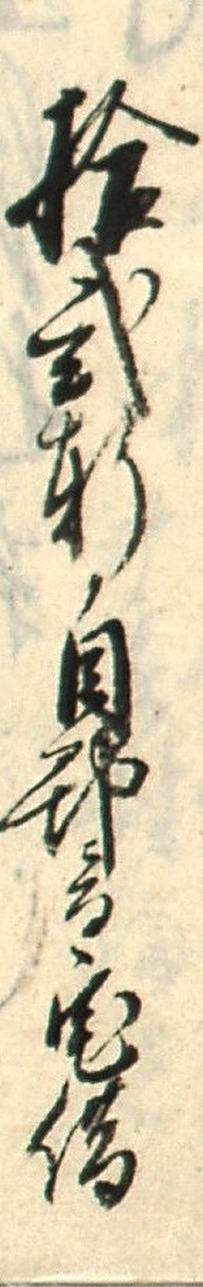拾弐軒自郡に而宅借
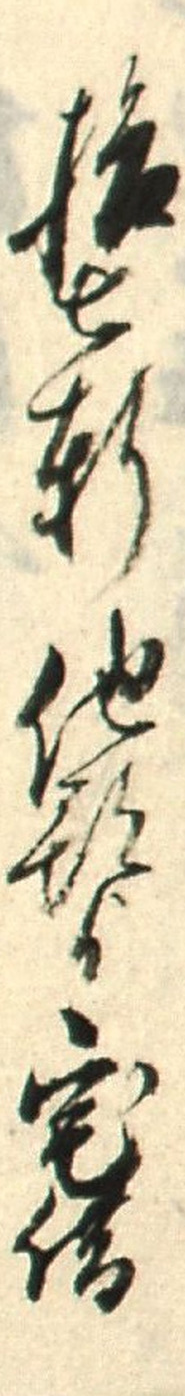拾七軒他郡ゟ宅借

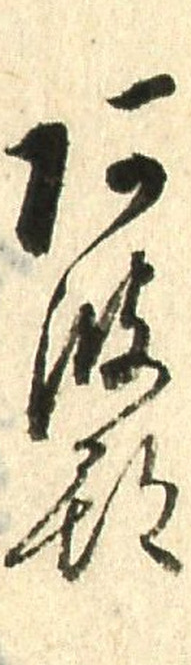阿波郡
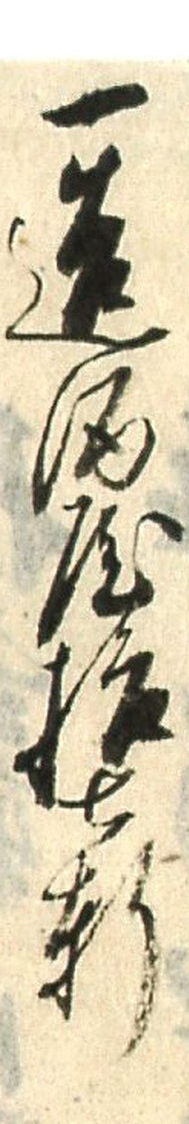一造酒屋拾七軒
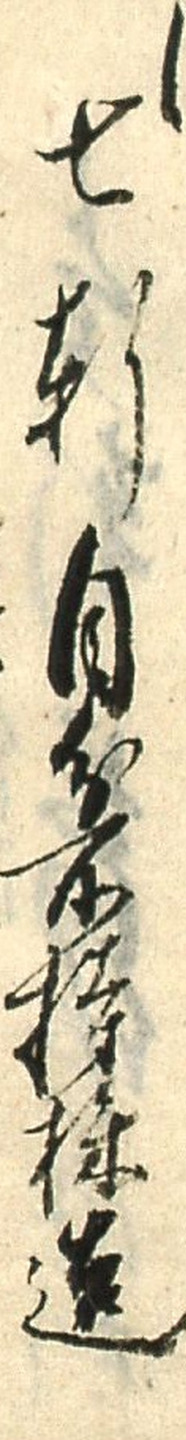七軒自分所持株造
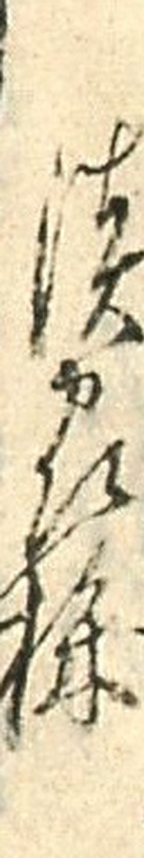淡州株
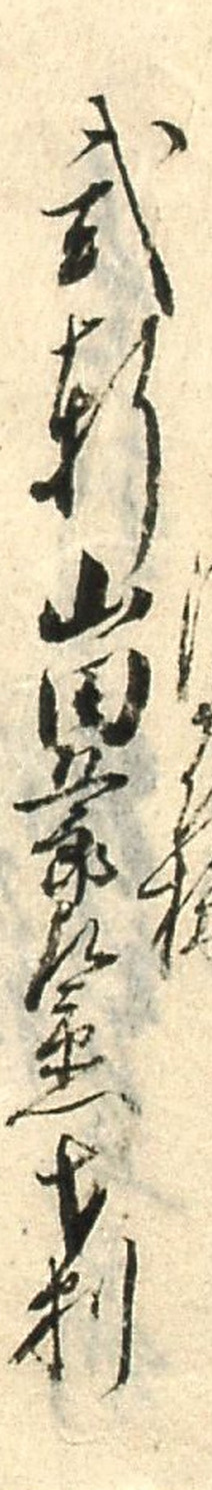弐軒山田五郎左衛門才判
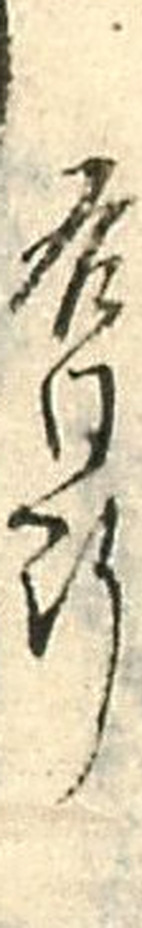右同断
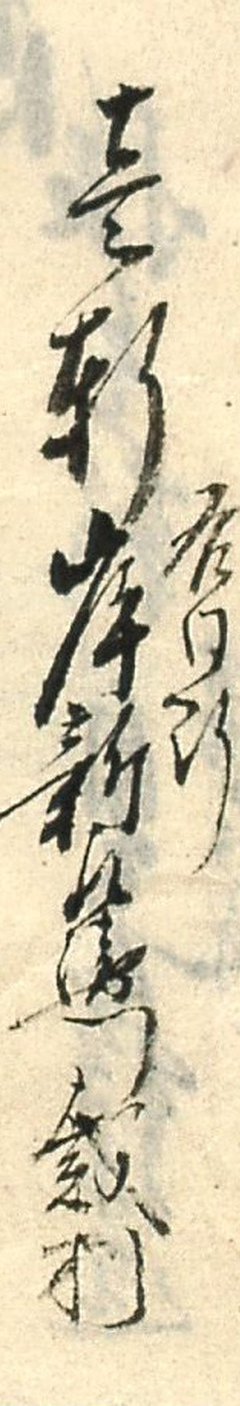壱軒岸新左衛門裁判
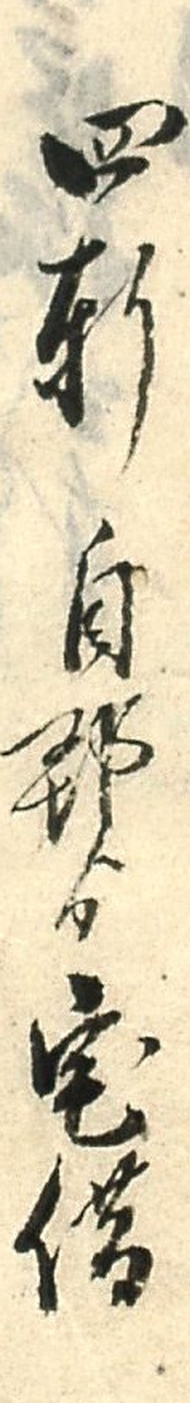四軒自郡ゟ宅借
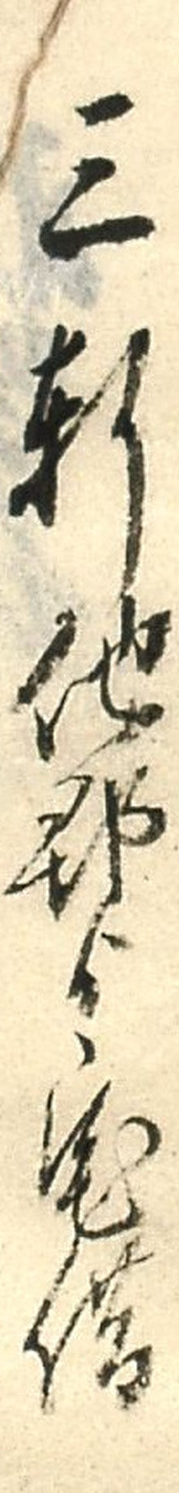三軒他郡ゟ宅借
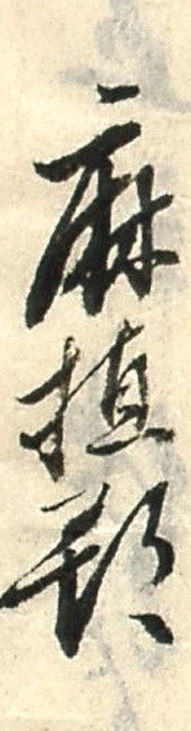麻植郡
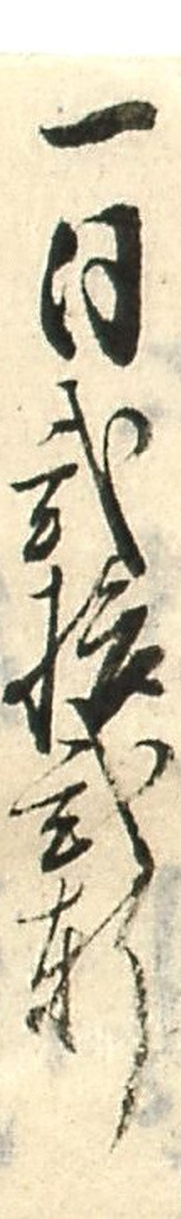一同弐拾弐軒
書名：南北拾郡造酒屋数並株数調子帳
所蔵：鳴門教育大学 Naruto University of Education
